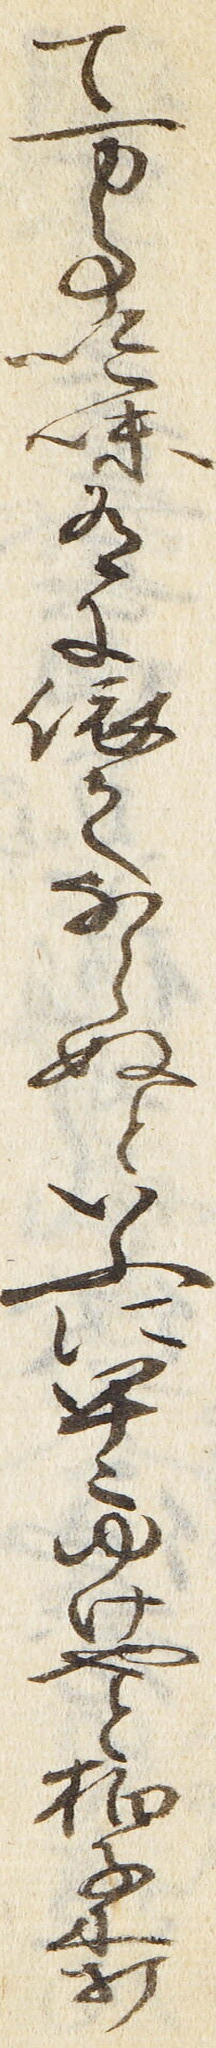て万事吟味有に依てならぬといふに早々ゆけやと拍子木打
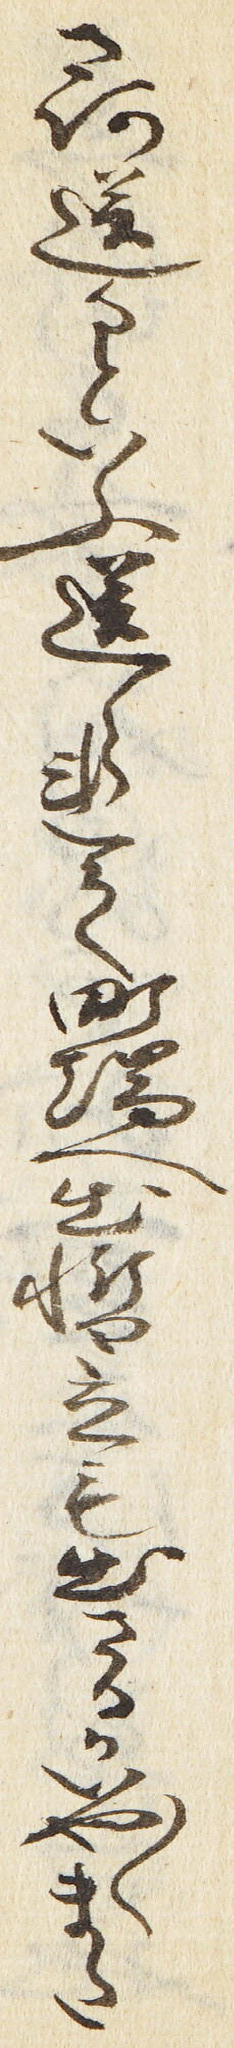さあ送るといふ送られて町端へ出暫立も出さるかいや〳〵また
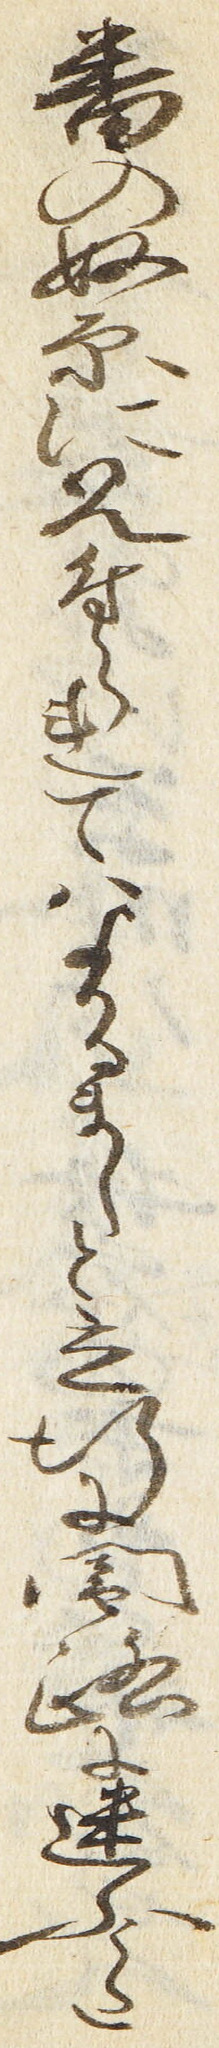番奴原に見付られてはよかるましと立行に闇路に迷ふた
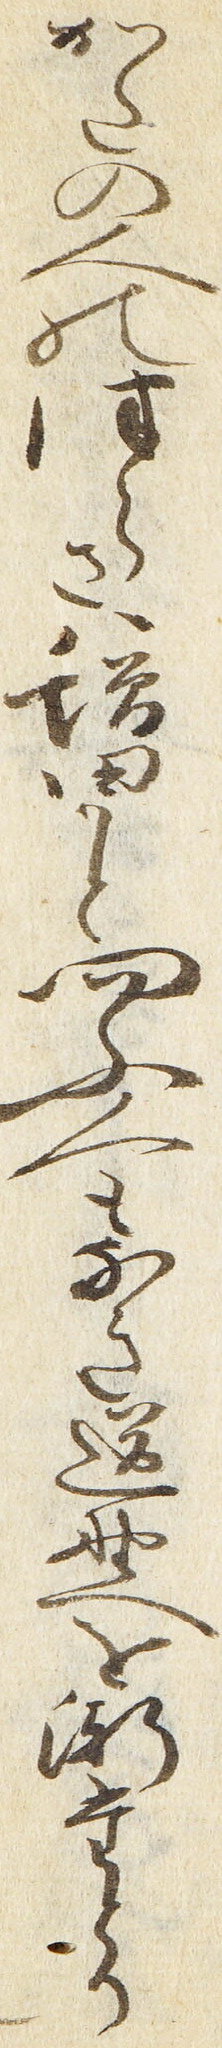かたの人のつらさは増田かと問ふ人もなき道野へを漸たとり
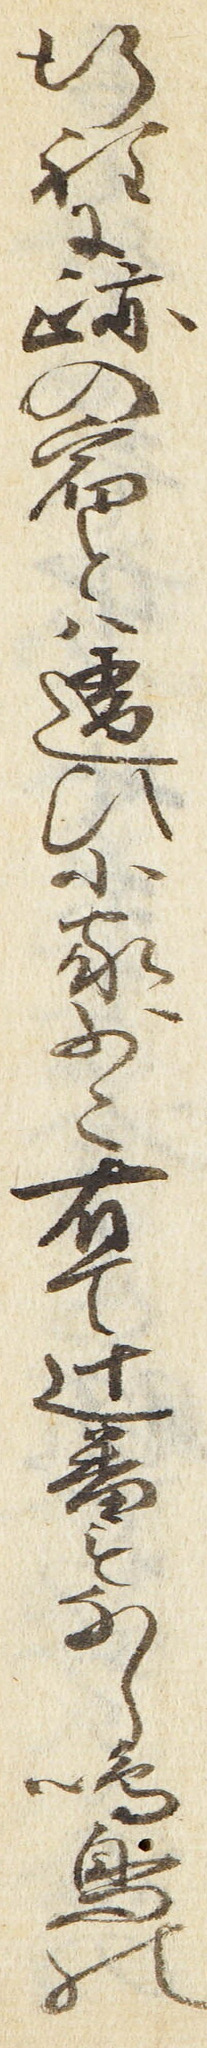行程に跡の宿とハ違ひ小家少々有て辻番もなし鳴鳥の

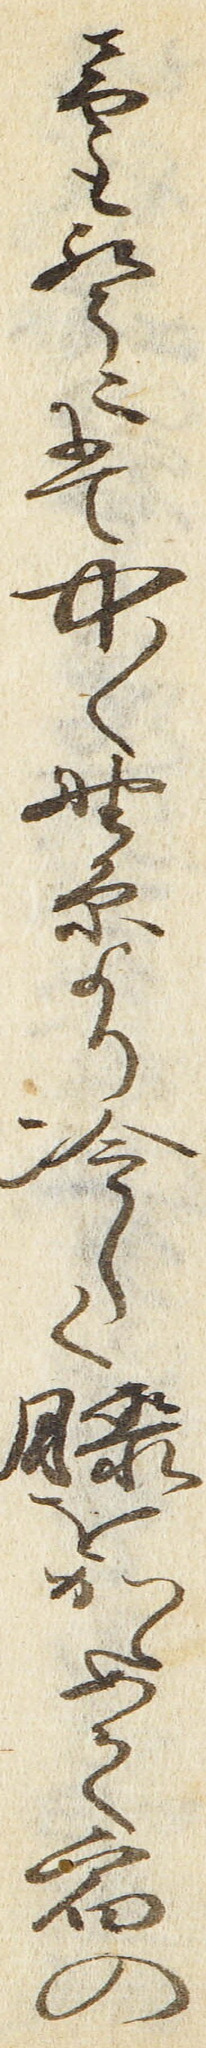音とも声々にて中〳〵野原より冷しく膝をかゝめて宿の
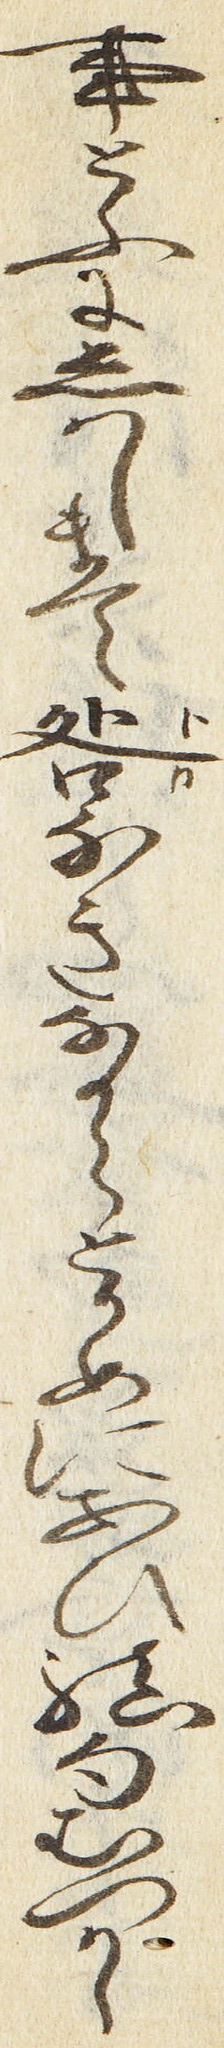事とふにしはしまて咎なきなからとかめにあひ結句むつかし
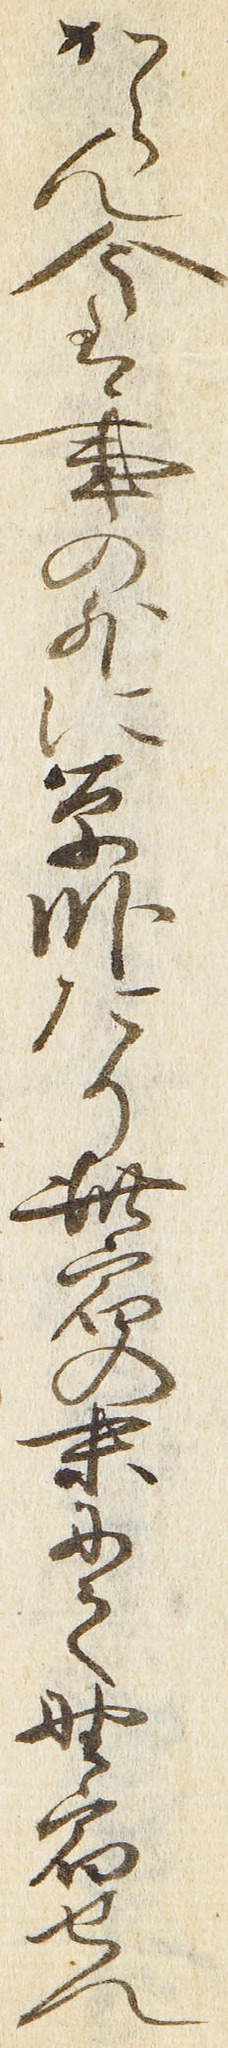からん今は事の外に草臥たり此宿の末にて野宿せん
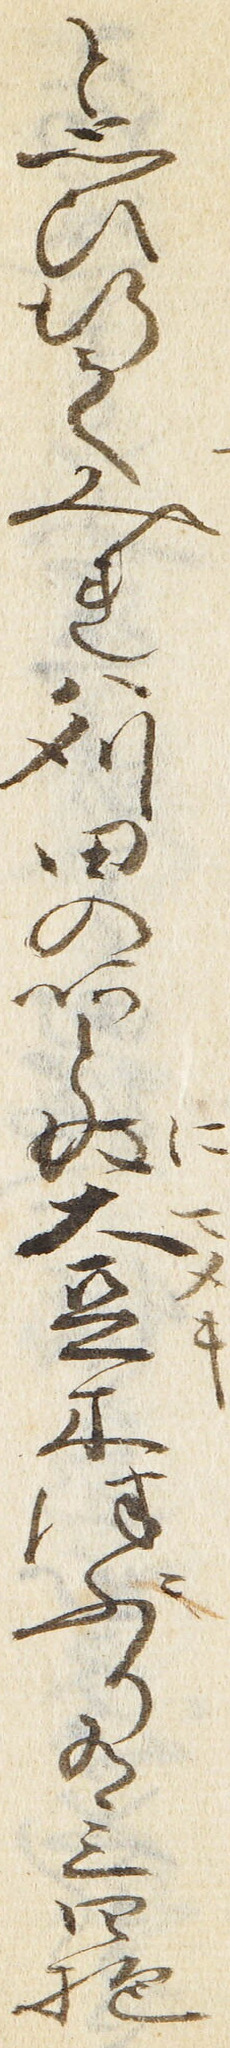と思ひ得てみれは刈田のあとに大豆木つぶり有三四把
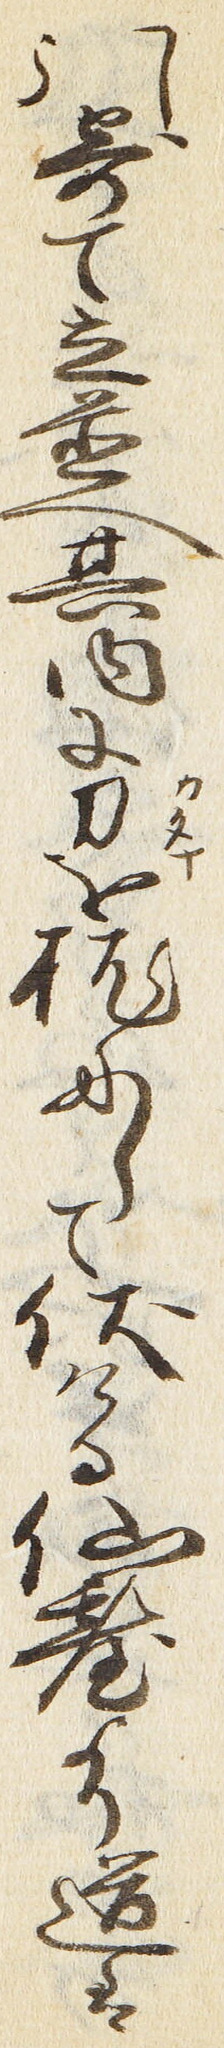引寄て立並へ其内に刀を枕にして伏ける仙台より道は
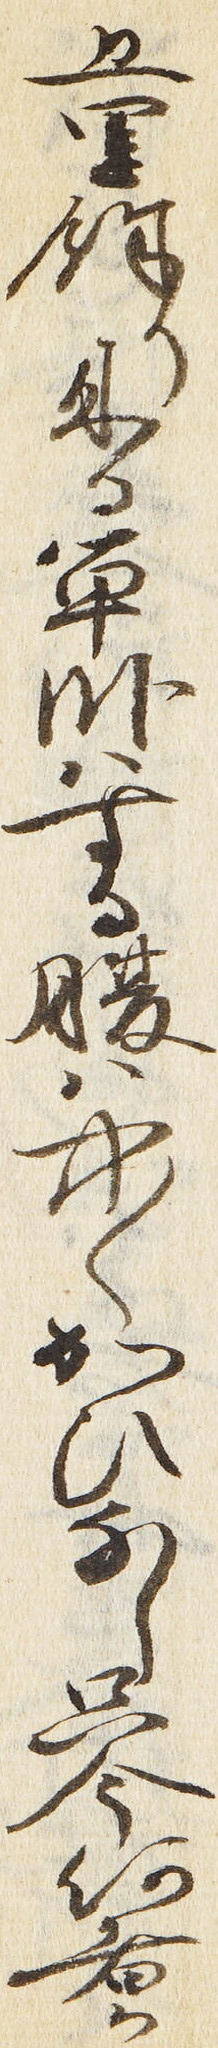五里余り来る草臥はする腹は中〳〵かひなし只今何者か
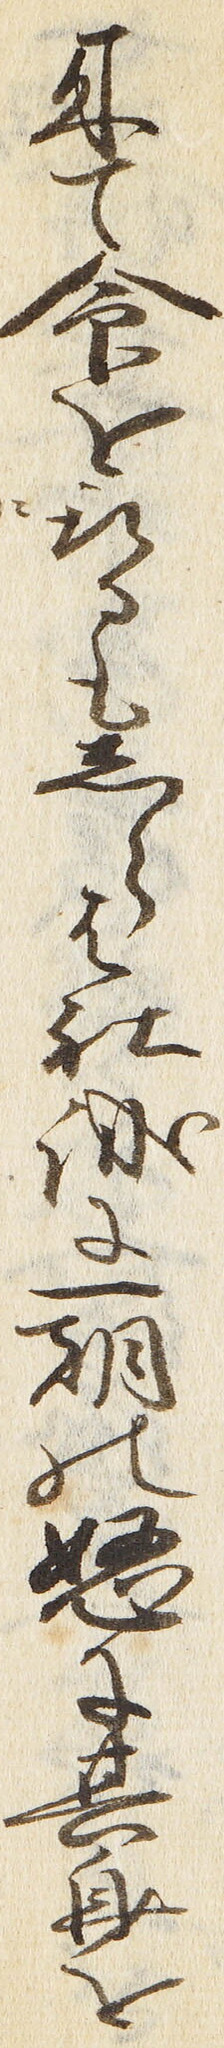来て命を取るもしらは社誠に一朝の怒に其身を
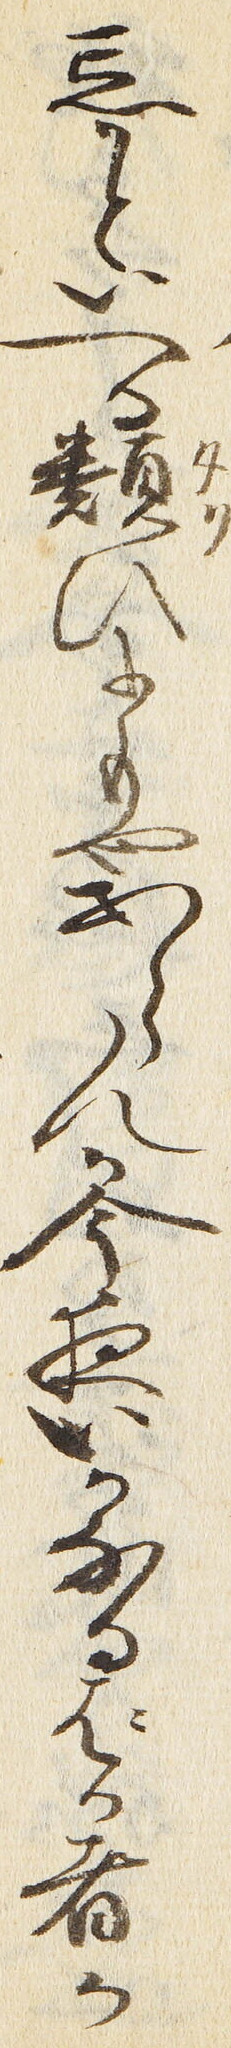忘かといへる類ひにもやあらんか今夜いかなるばか者か
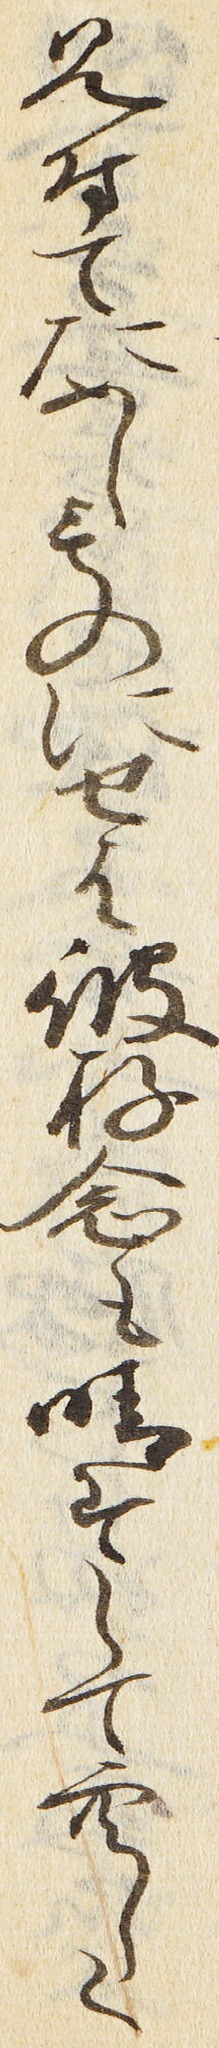見付てためしものにせは彼存念も晴すして空しく
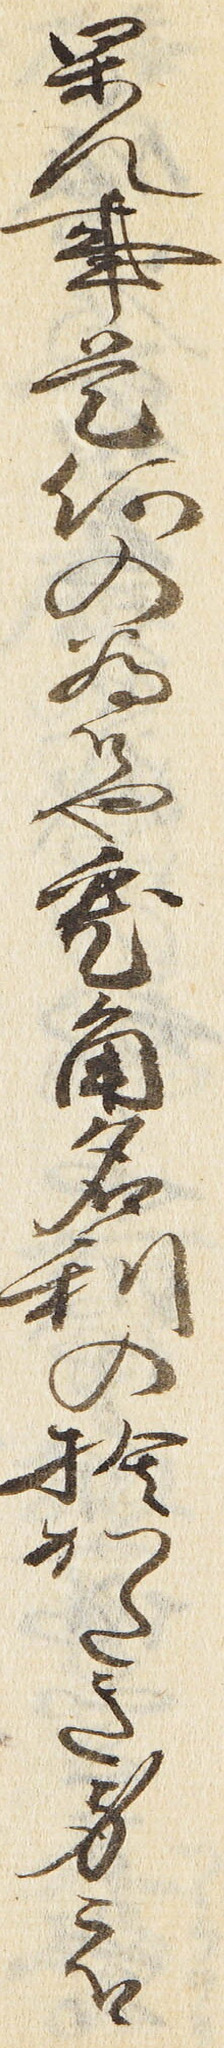果ん事是何の為そや兎角名利の捨かたき身こそ
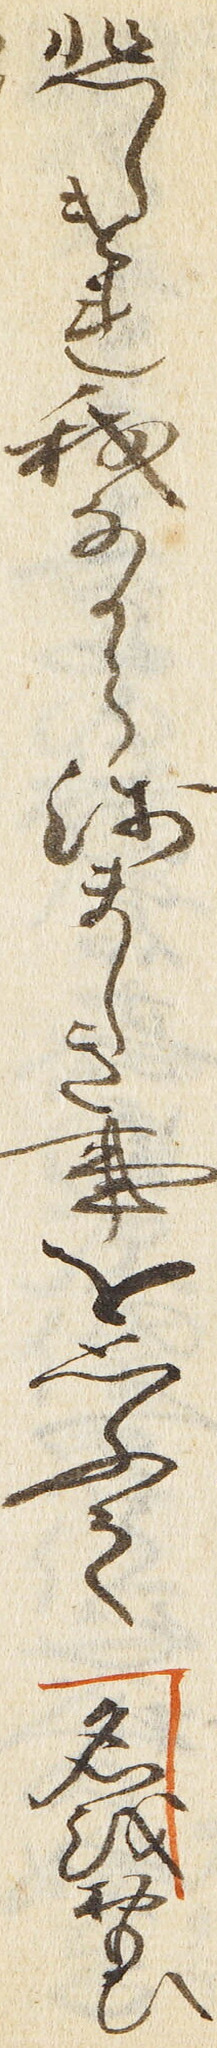悲しけれ我なから浅ましき事を思ふて「名をおもひ
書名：海陸世話日記
